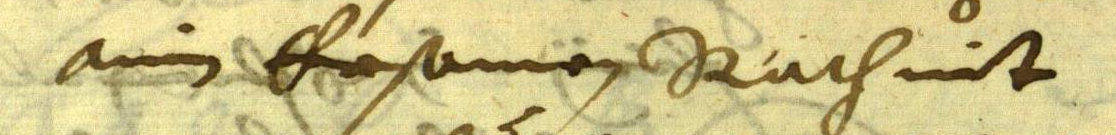aim Ersamen Rath nit
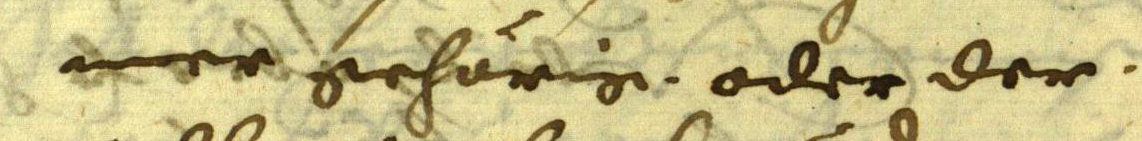mer gehōrig. oder der¬
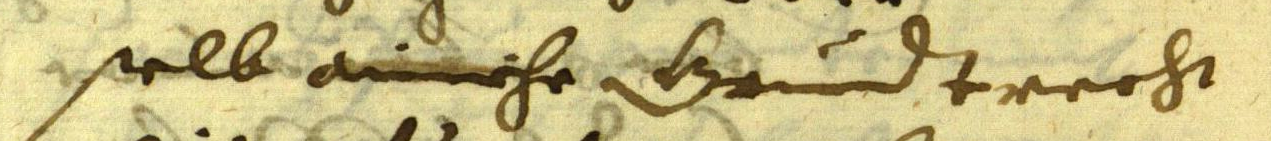selb ainiche Grūndtrecht
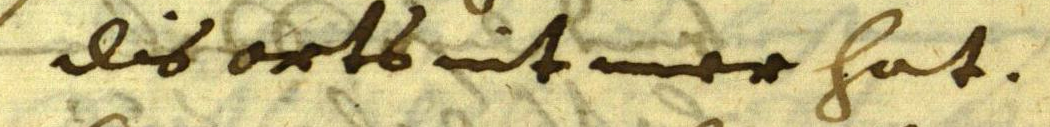dis orts nit mer hat.
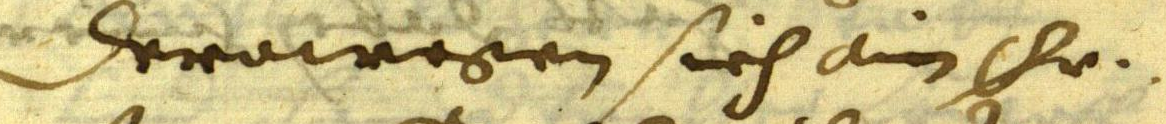Derowegen sich ain Er¬
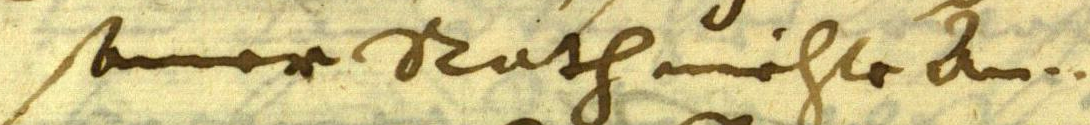samer Rath nichte An¬
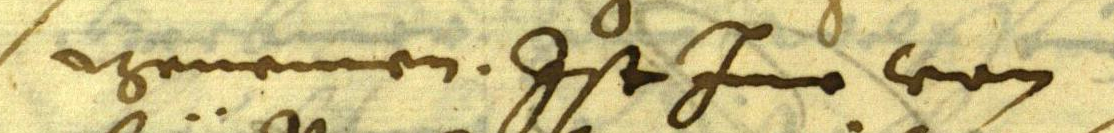zenemen. Ist Ime von
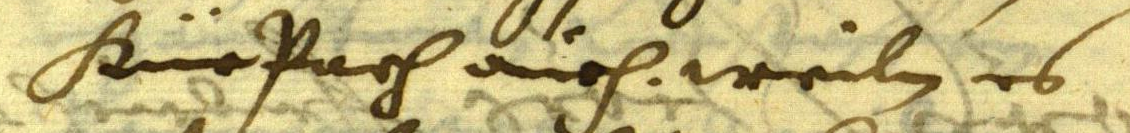Küe Pach aūch. weiln es
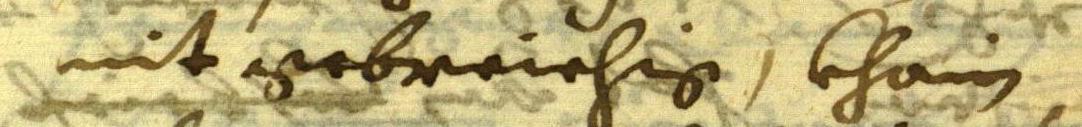nit gebreichig, khain
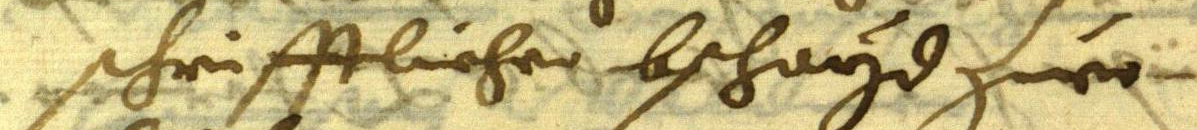schrifftlicher bschaȳd Zūer¬
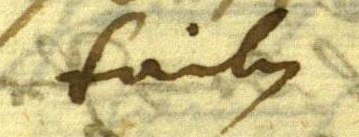tailn
